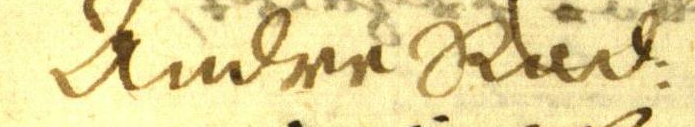Andre Rad¬
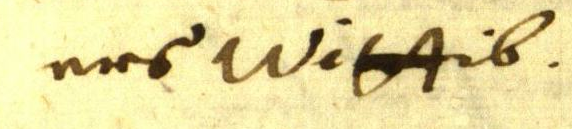ers Wittib.
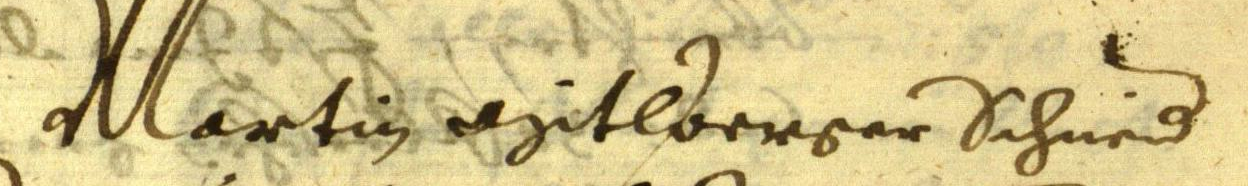Martin Mitlperger Schneid
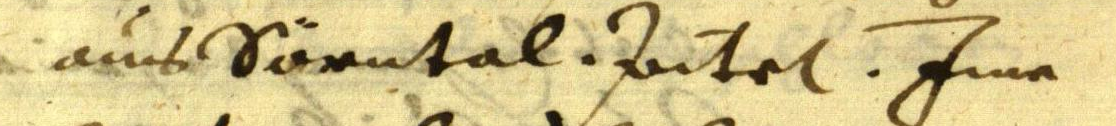aūs Särntal. Pitet. Ime
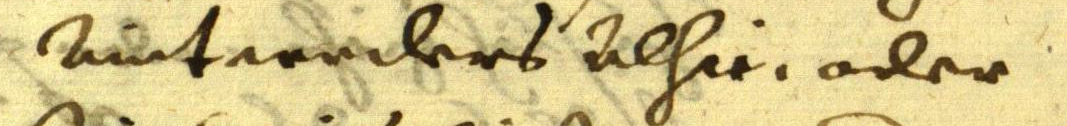Aintweders Alhie. oder
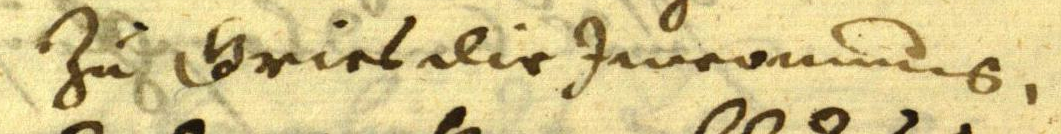Zū Gries die Inwonūng.
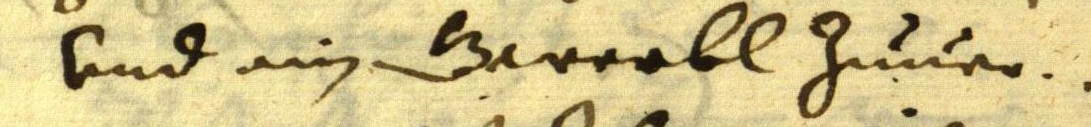vnd ain Gwerbl Zūūer¬
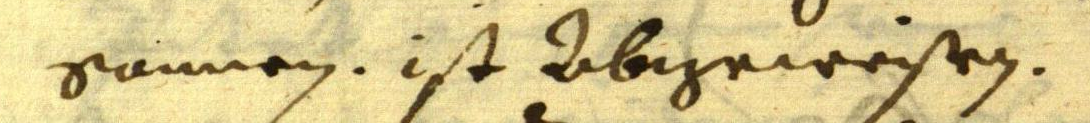gonnen ist Abzeweisen.
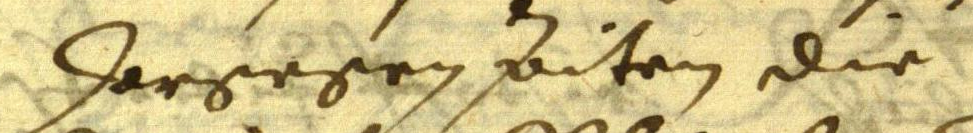Dargegen Piten die
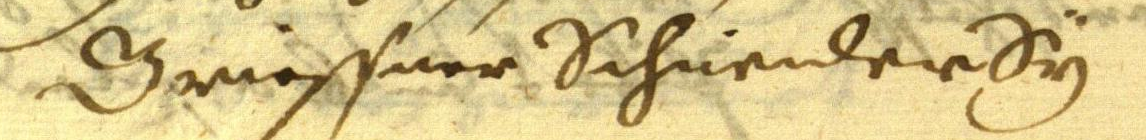Griessner Schneider Sÿ
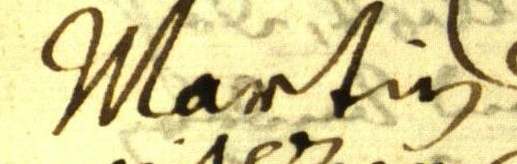Martin
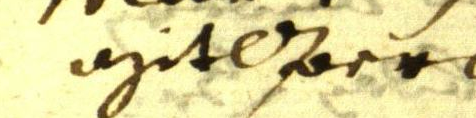Mitlperg.
